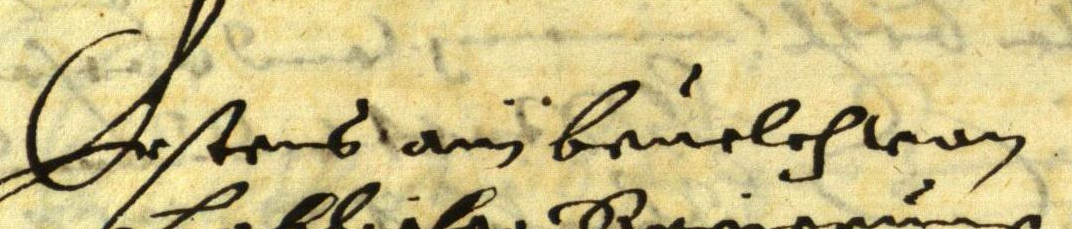Erstens ain beūelch von
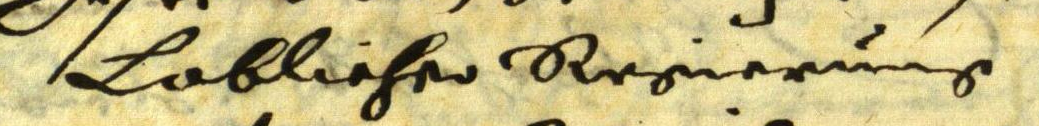Loblicher Regierūng
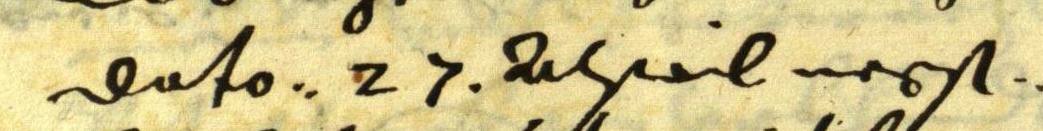dato: 27. April negst¬
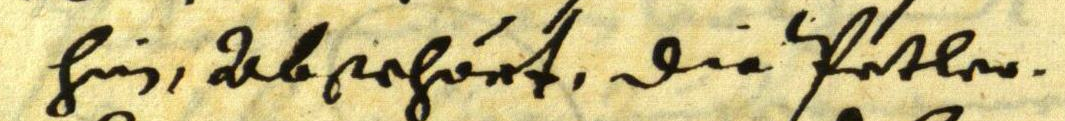hin, Abgehōrt. die Petler.
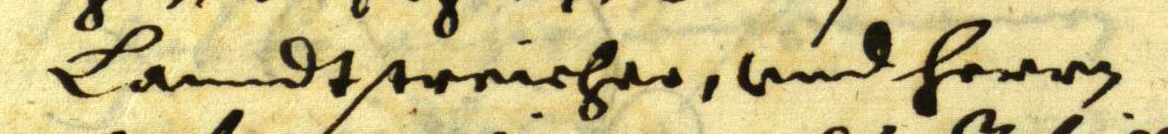Lanndtstreicher, vnd herrn
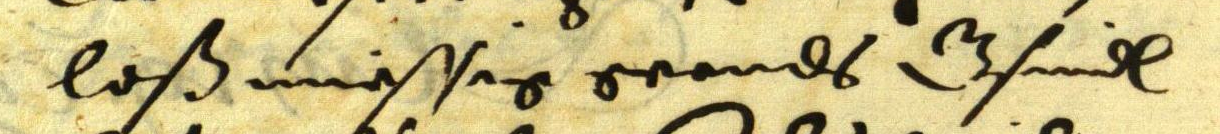loß miessig geends Gsindl
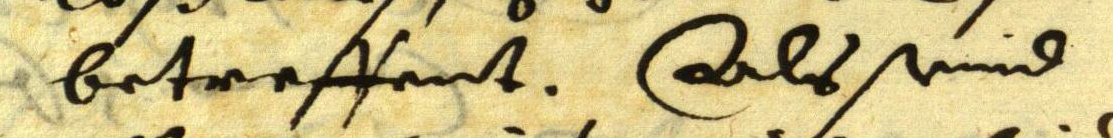betreffent. Als seind
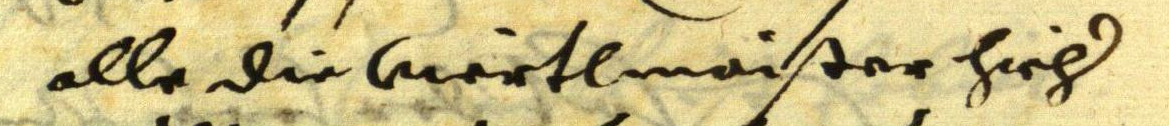alle die Viertlmaister hieh
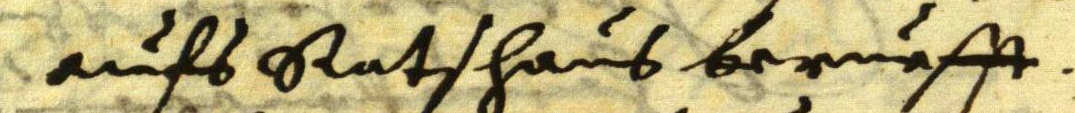aūfs Ratshaūs berūefft.
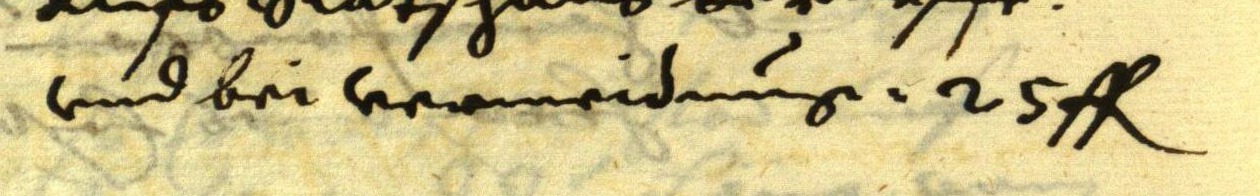vnd bei vermeidūng: 25 fl
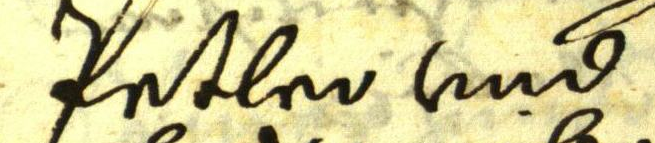Petler vnd
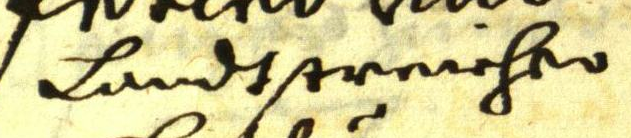Landtstreicher
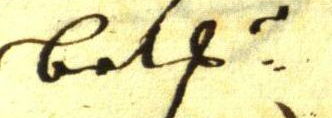bet:
